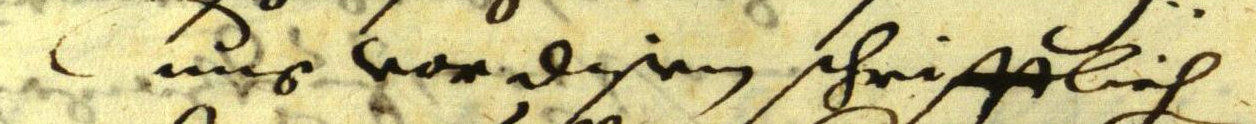ūng vor disem schrifftlich
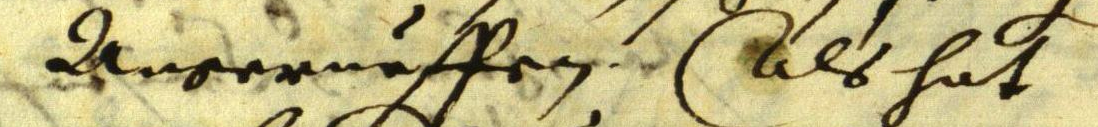Angerūeffen. Als hat
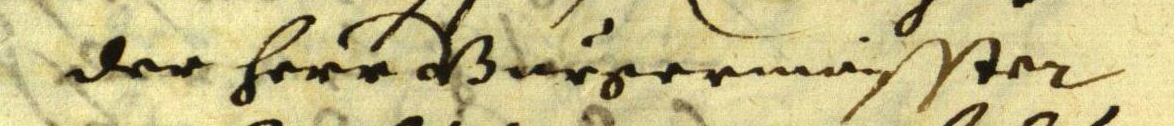der herr Būrgermaisster
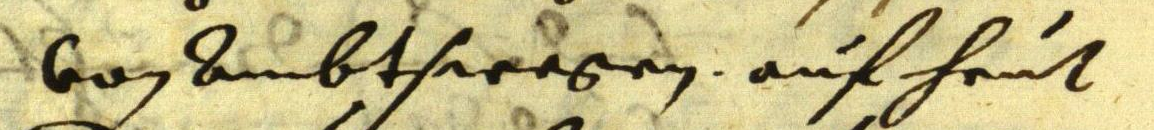von Ambtswegen. aūf heūt
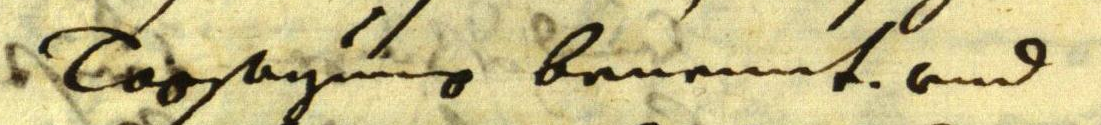Tagsazūng benennt. vnd
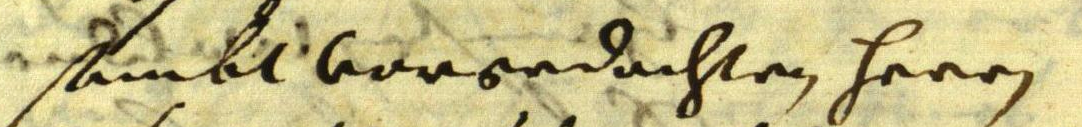sambt vorgedachten herrn
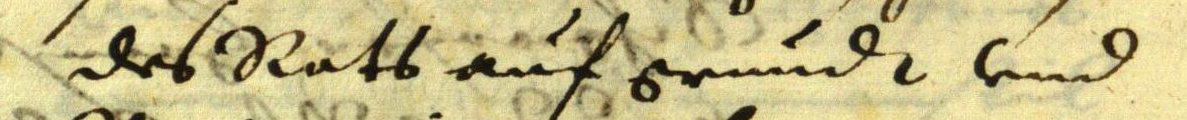des Rats aūf grūndt vnd
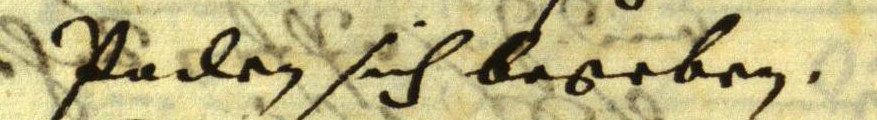Poden sich begeben.
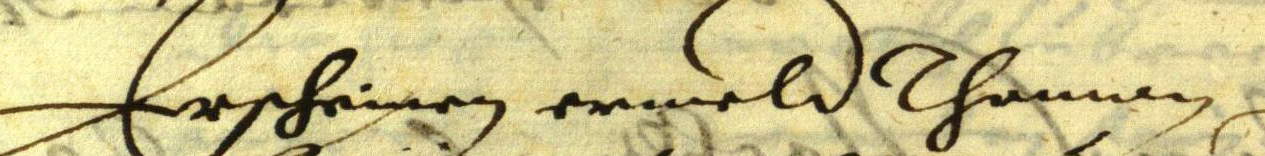Erscheinen ermelt Thoman
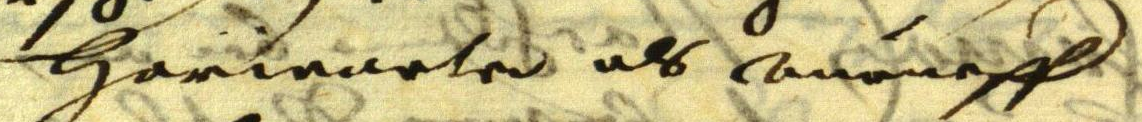Hörwarter als Anrūeff
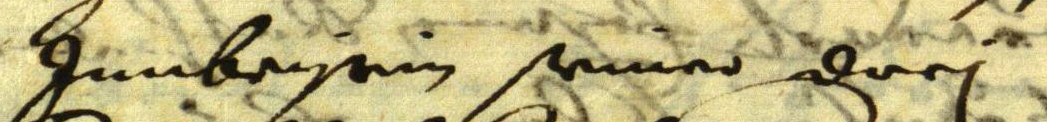Innbeisein seiner drej
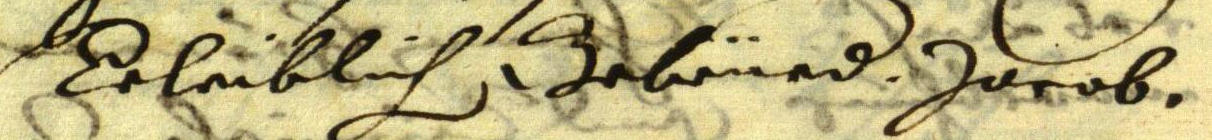Eeleiblich Gebrüed. Jacob,
